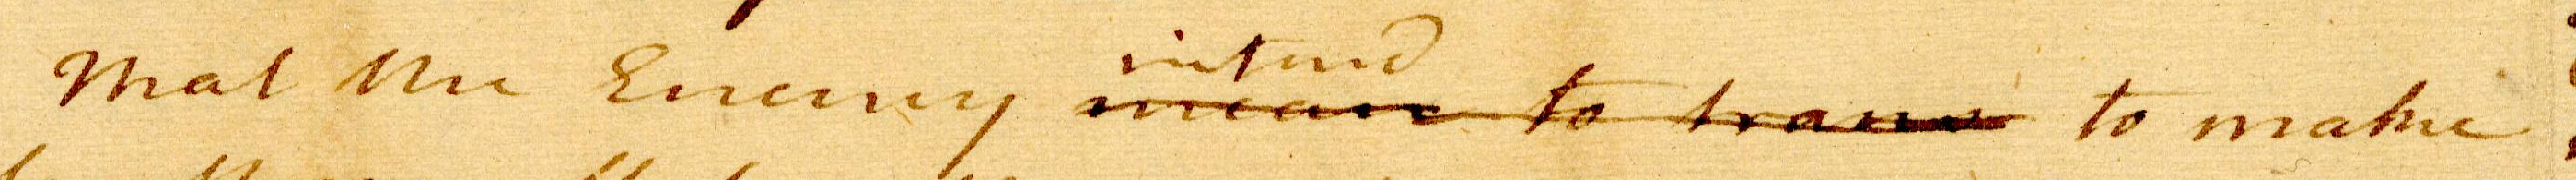that the Enemy [mean to trans] to make
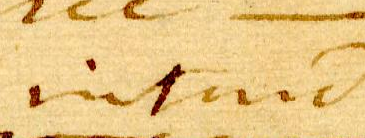intend
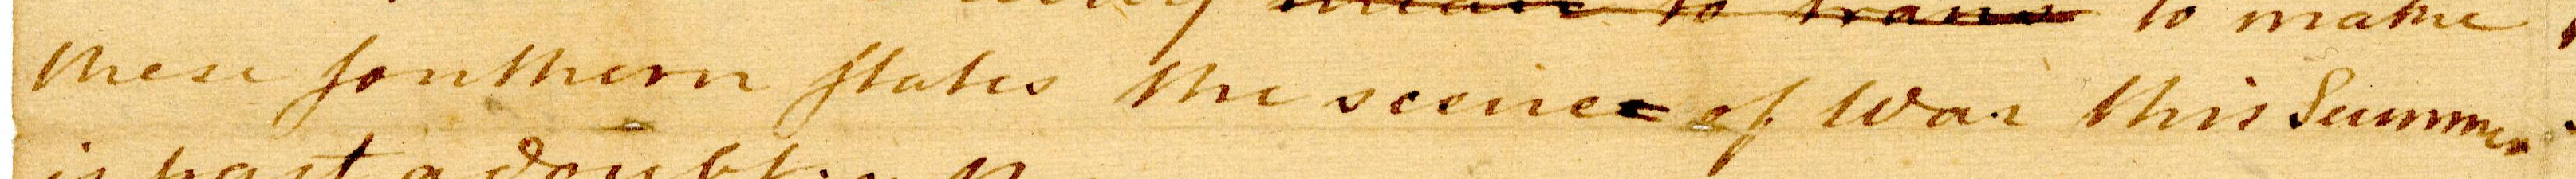these southern states the scene of War this Summer
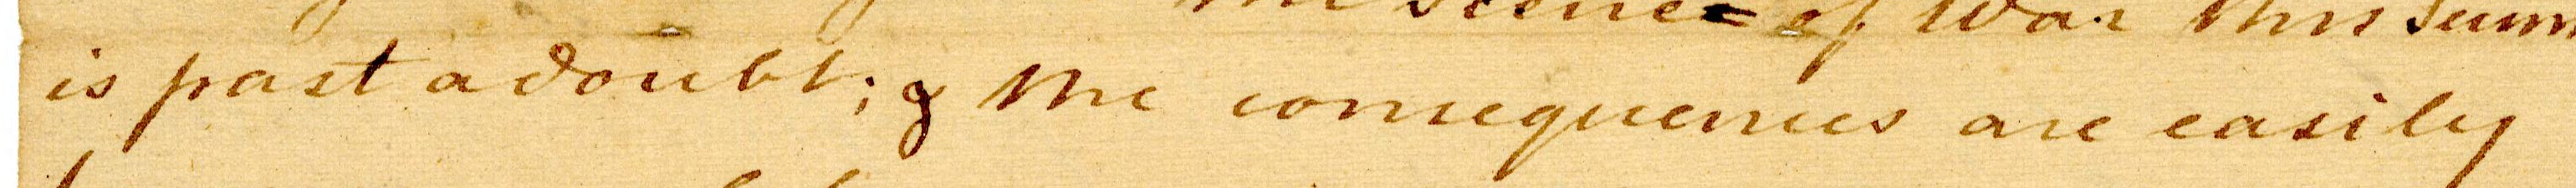is past a doubt; & the consequences are easily
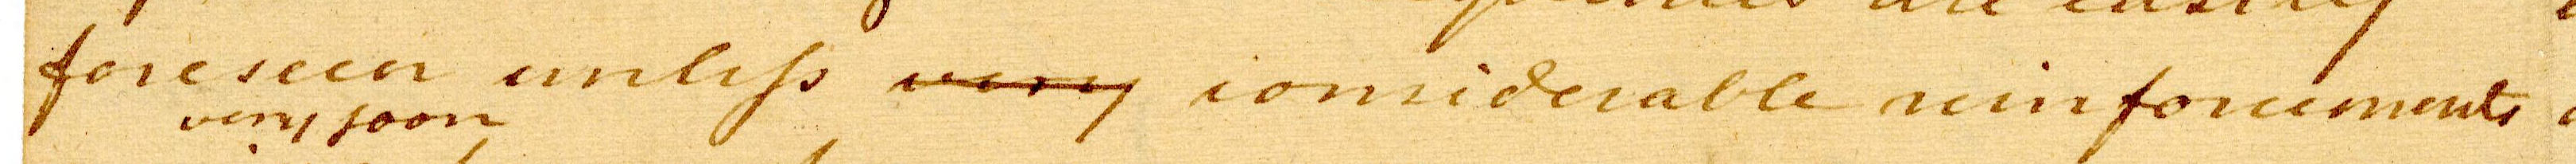foreseen unless [very] considerable reinforcements
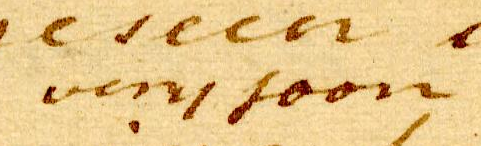very soon
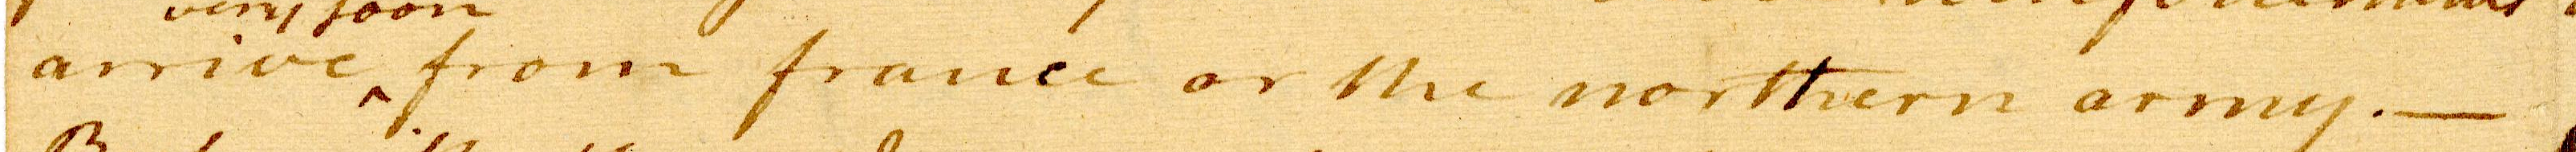arrive from france or the northern army.-
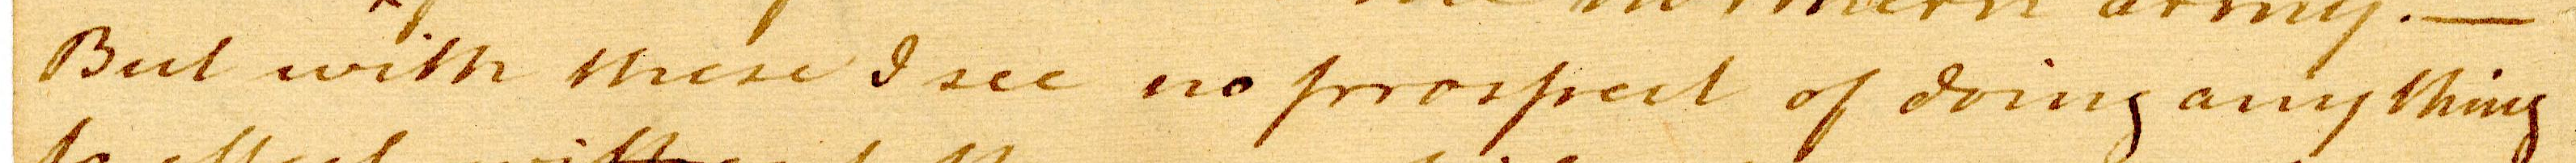But with these I see no prospect of doing anything
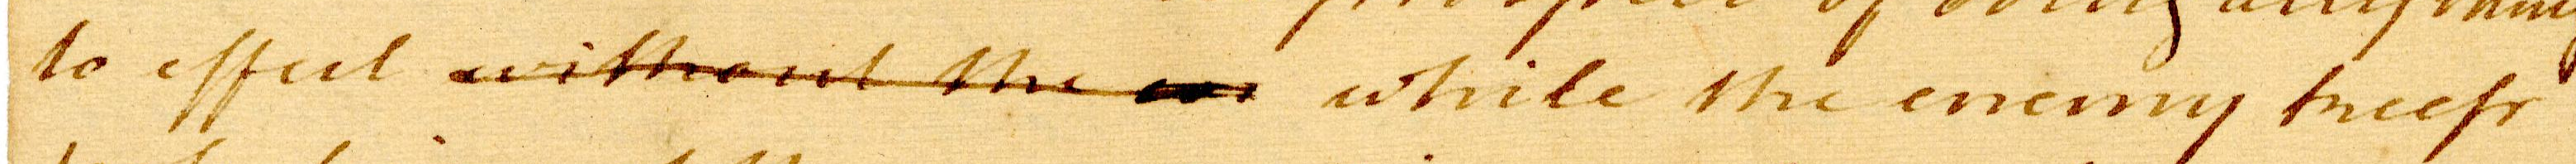to effect [without the __] while the enemy keeps
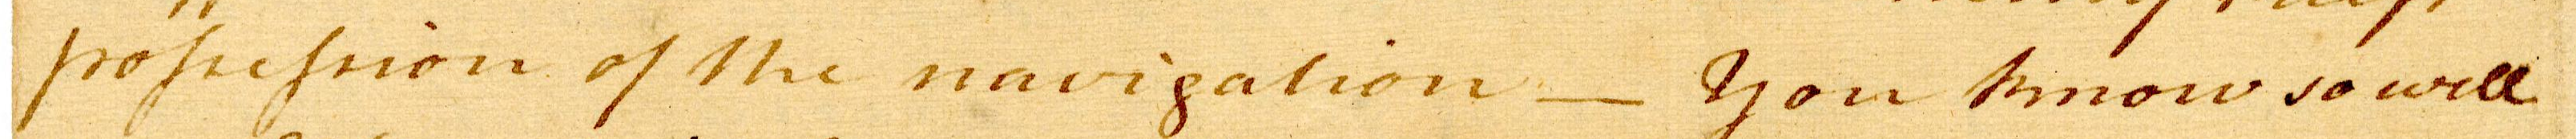possession of the navigation- You know so well
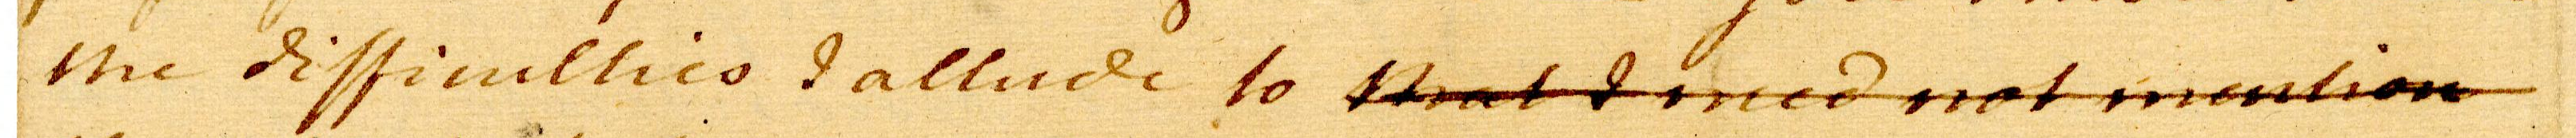the difficulties I allude to [that I need not mention]
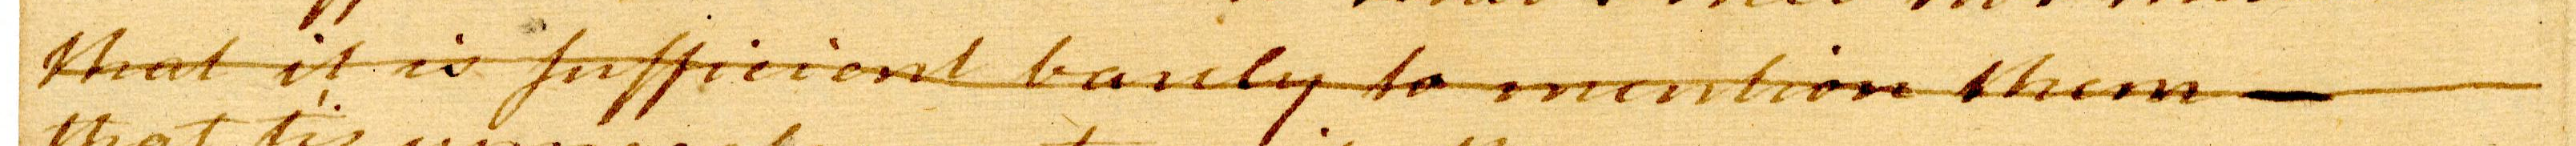[that it is sufficient barely to mention them-]
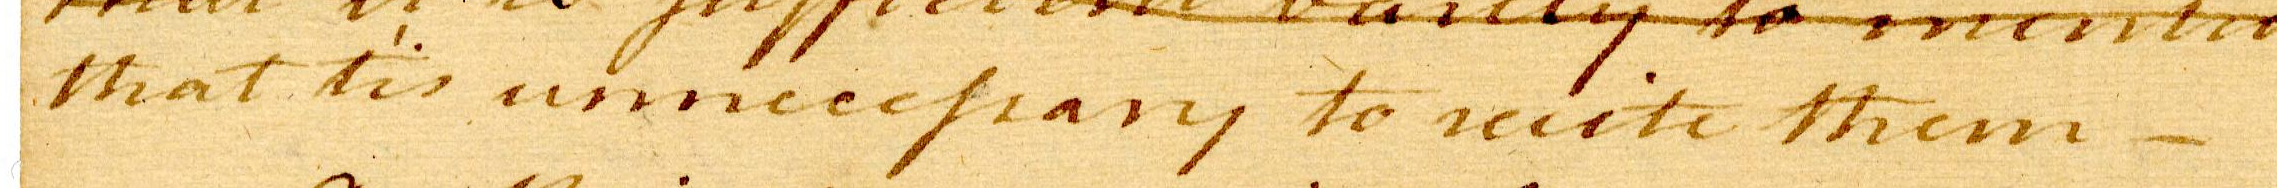that tis unnecessary to recite them-
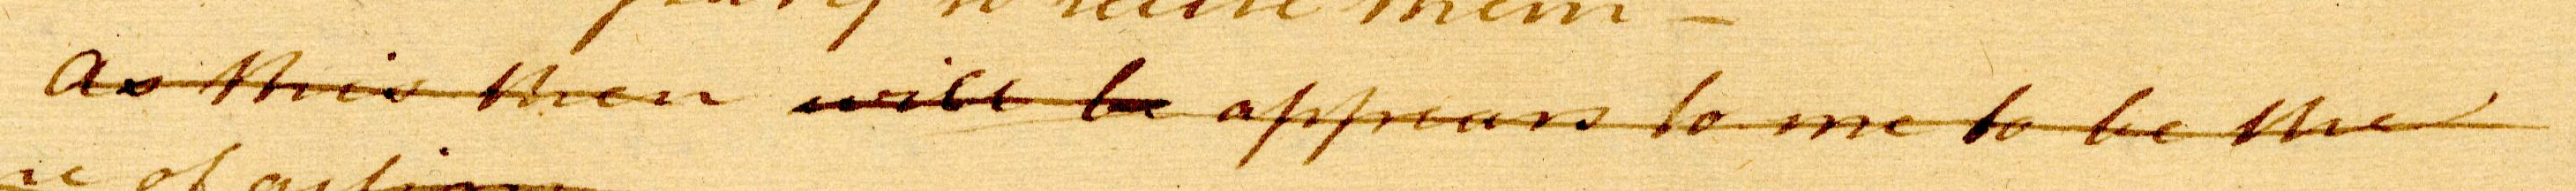[As this then will be appears to me to be the]
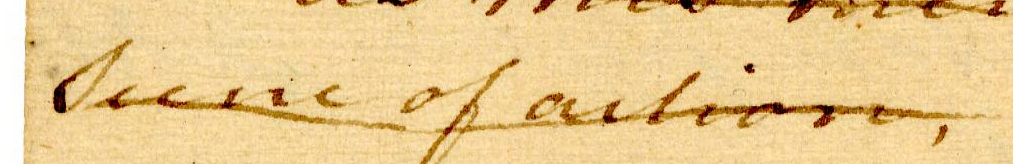[scene of action,]
